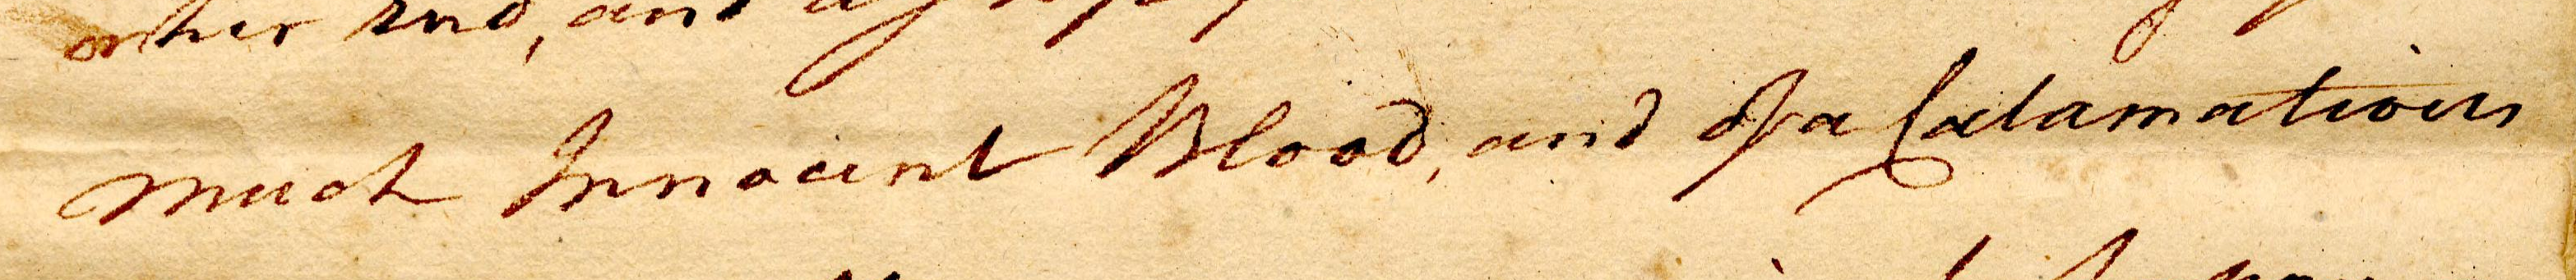much Innocent blood, and of a Calamatious
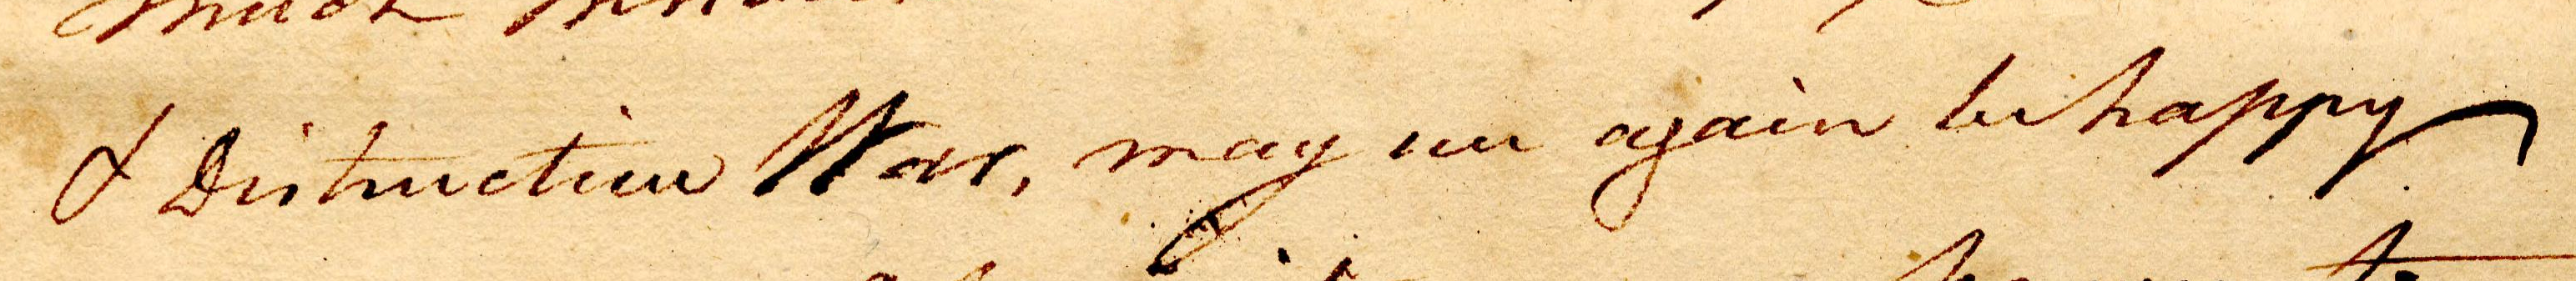& Distructive War, may we again be happy
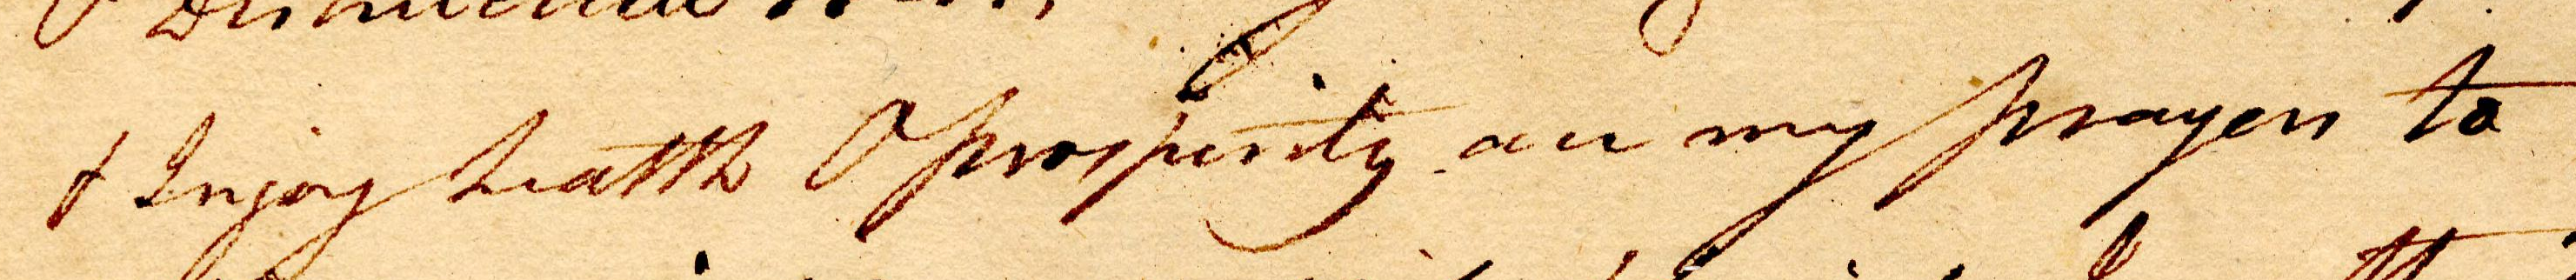& Enjoy health & prosperity are my prayers to
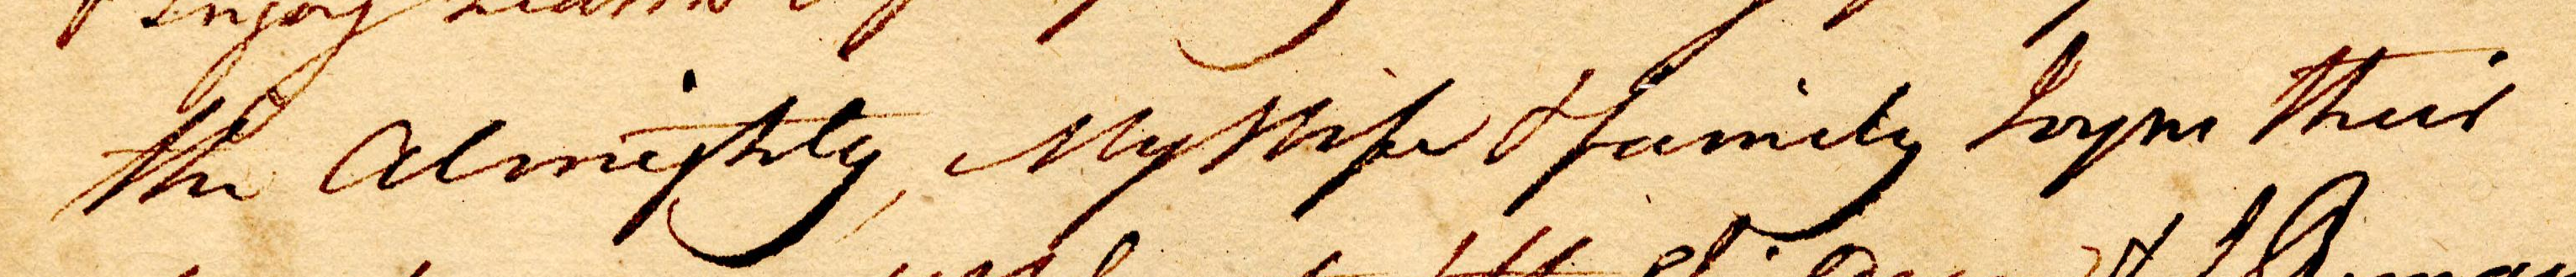the Almighty, My wife & family joyns their
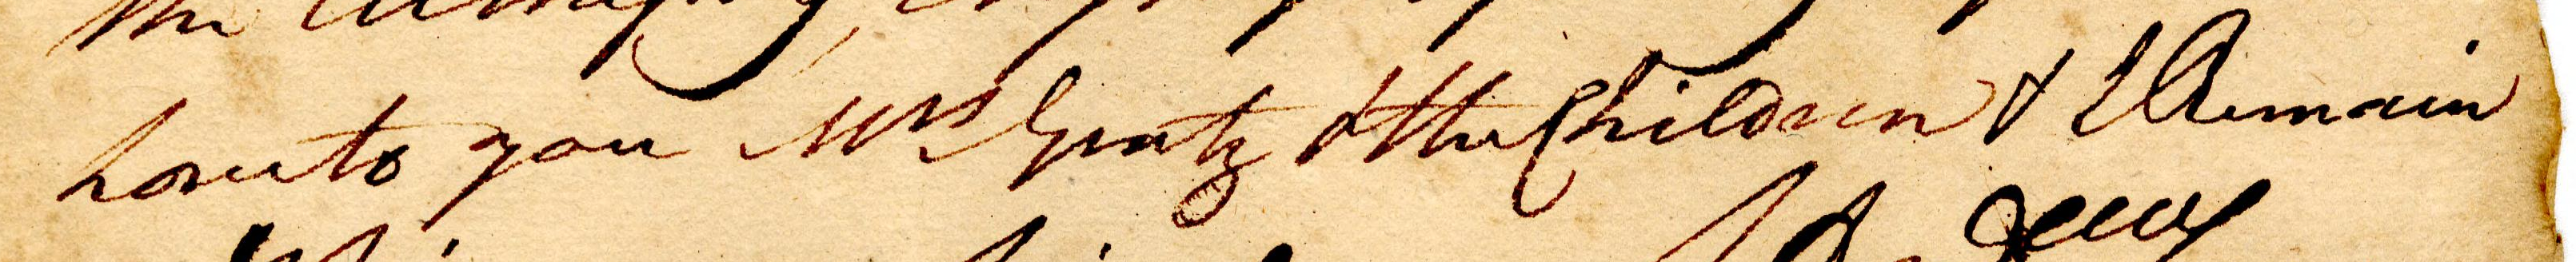Love to you M^rs. Gratz & the Children & Remain
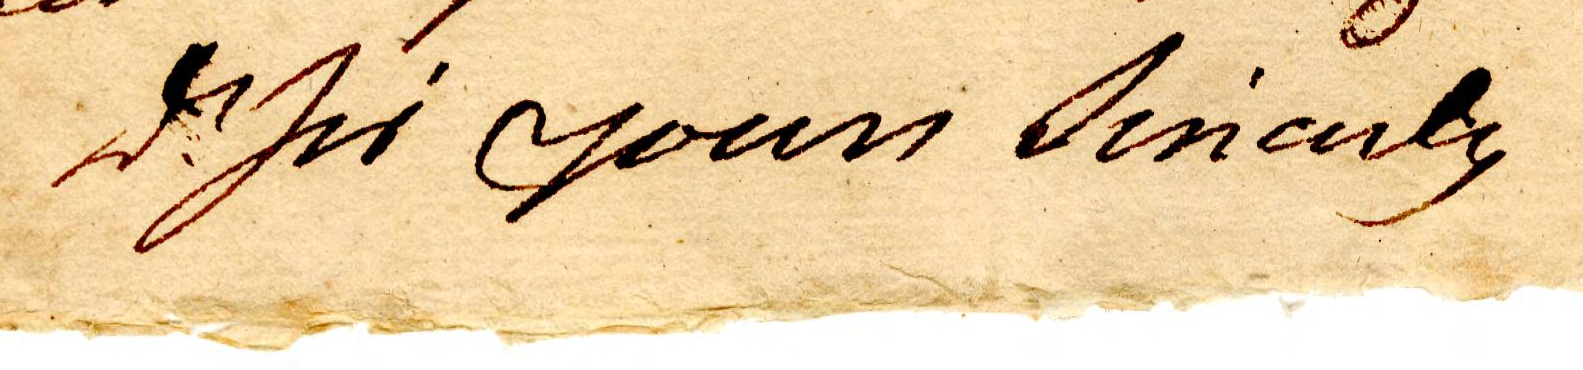D^r Sir Yours sincerly
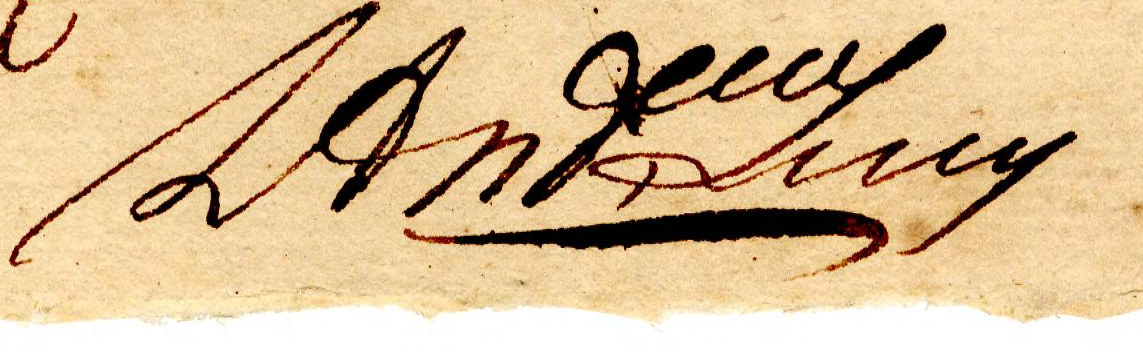And^rew Levy
